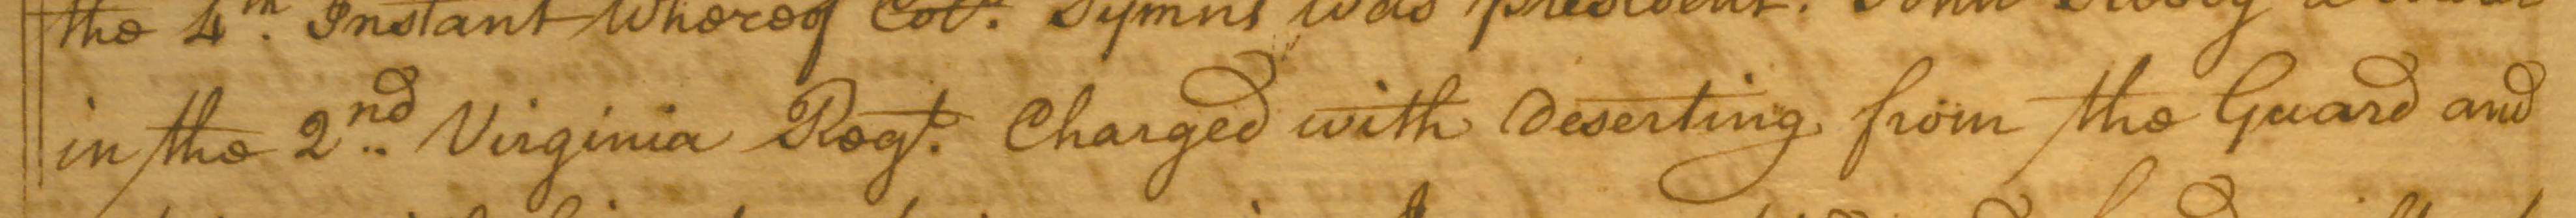in the 2^nd. Virginia Reg^t. Charged with deserting from the Guard and
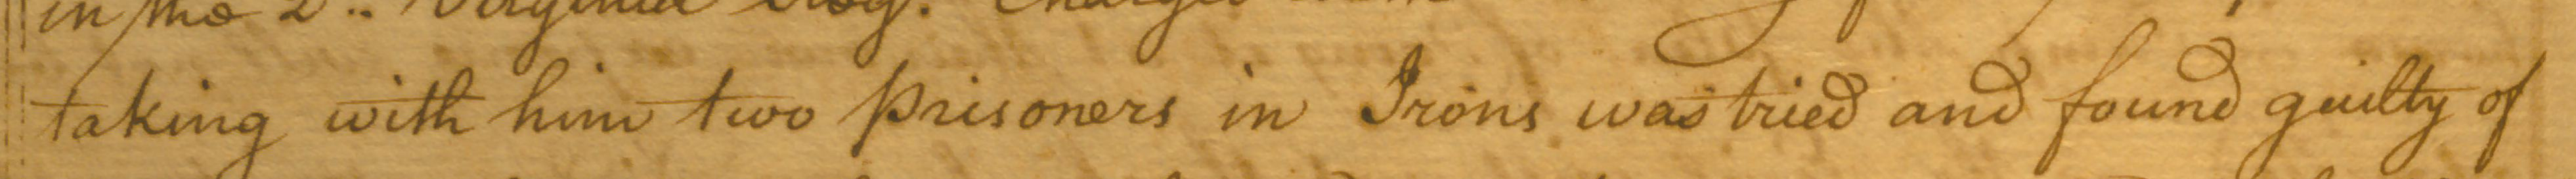taking with him two prisoners in Irons was tried and found guilty of
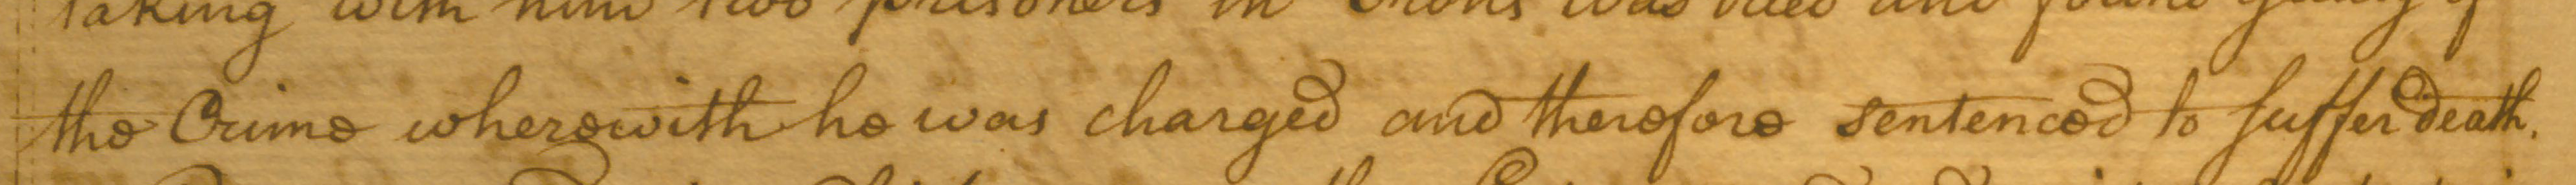the Crime wherewith he was charged and therefore sentenced to suffer death.
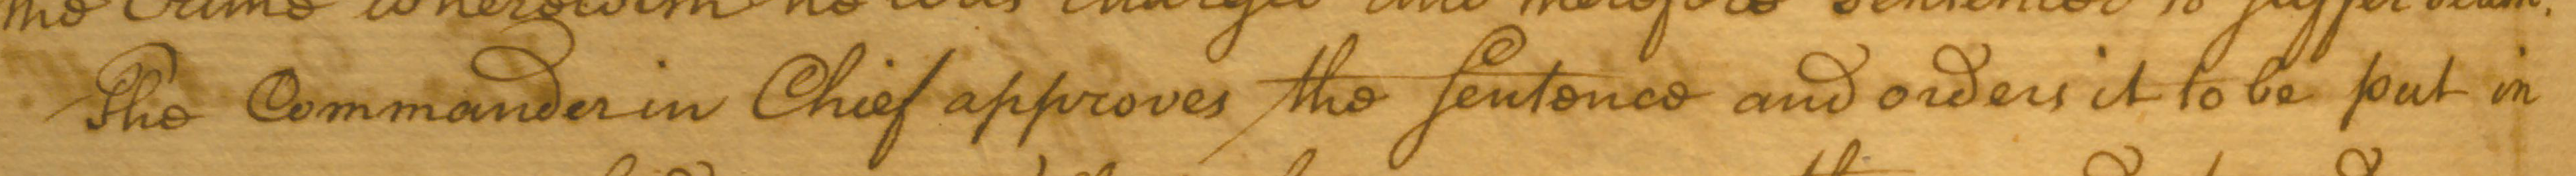The Commander in Chief approves the Sentence and orders it to be put in
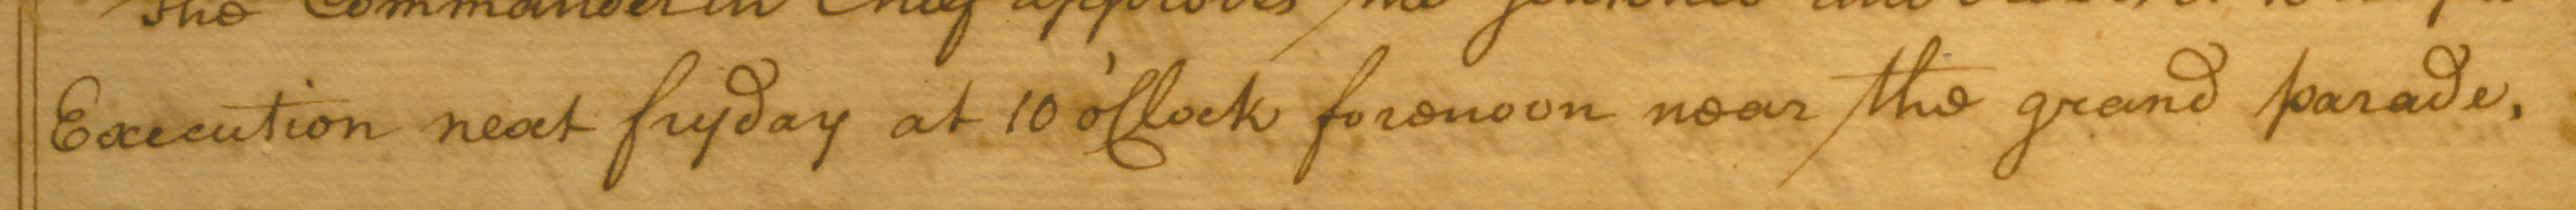Execution next fryday at 10 o'Clock forenoon near the ground parade.
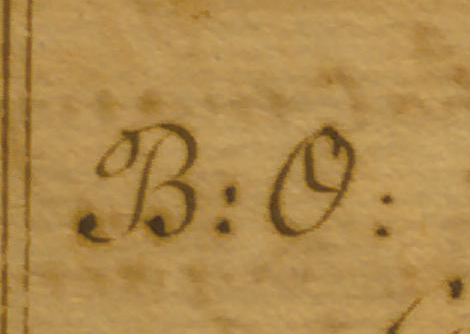B:O:
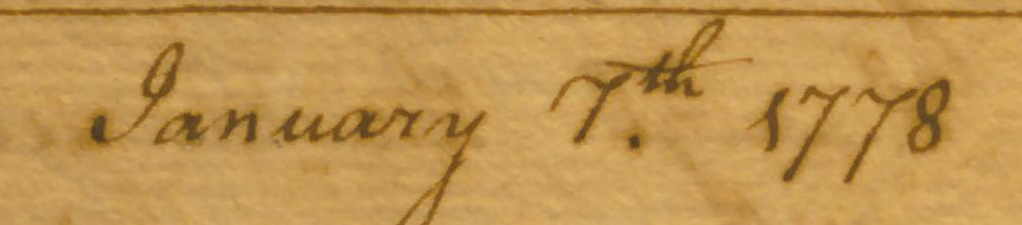January 7^th. 1778
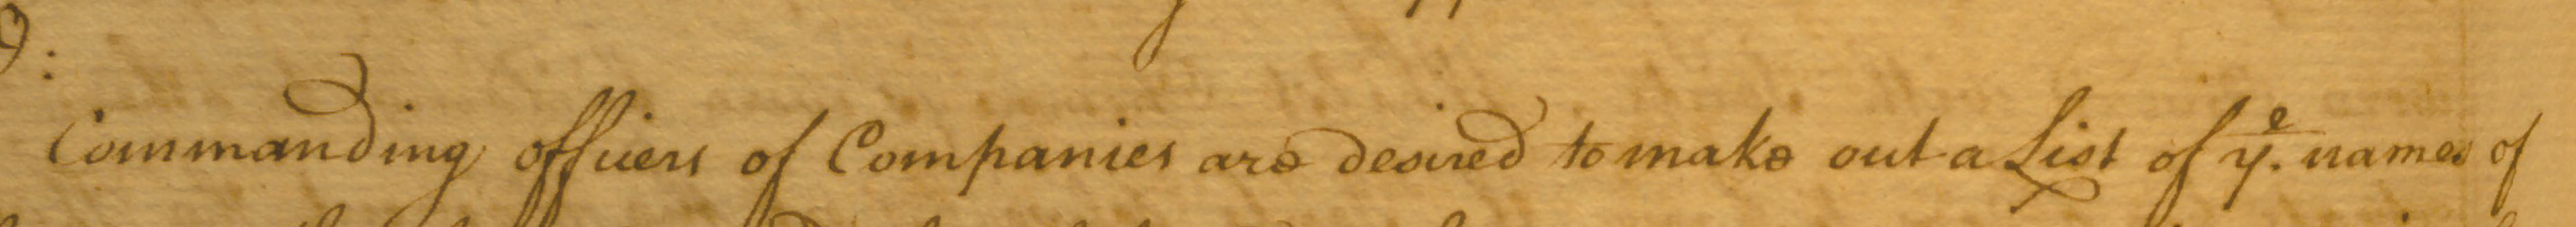Commanding officers of Companies are desired to make out a List of y^e. names of
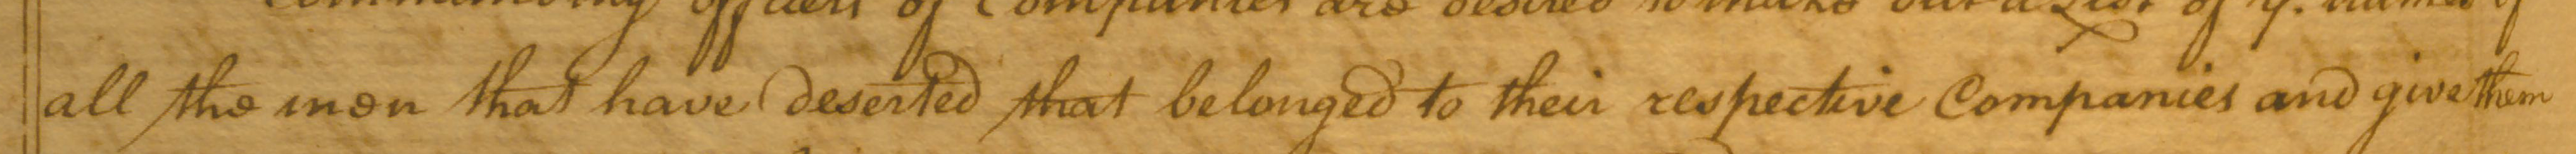all the men that have deserted that belonged to their respective Companies and give them
